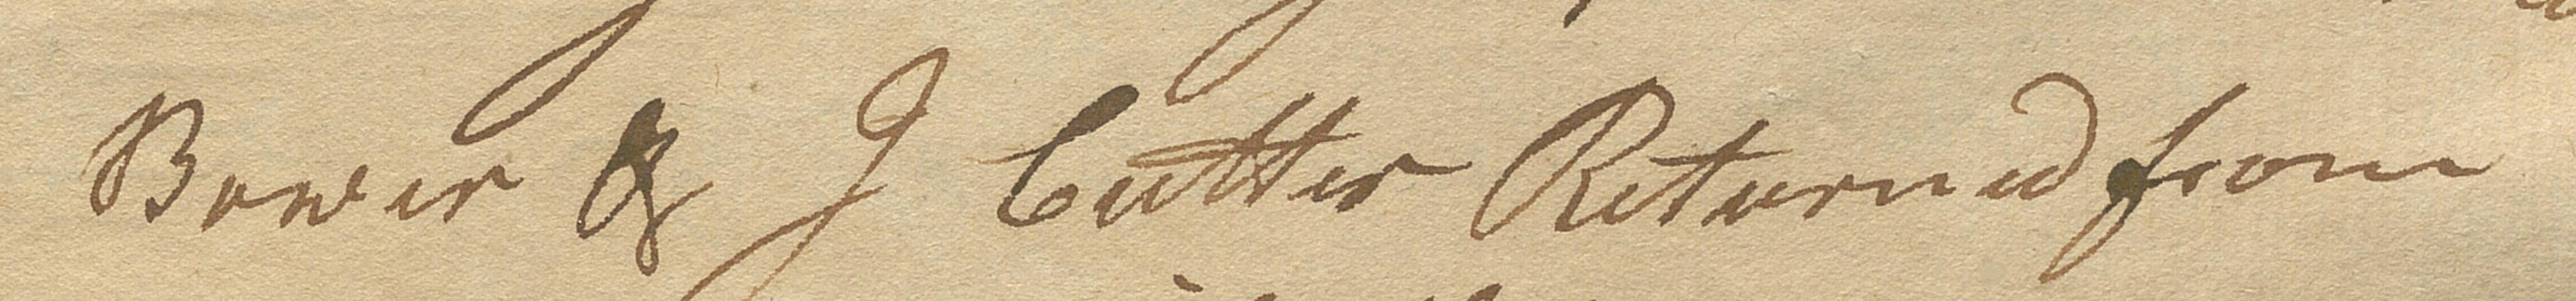Bawer & J Cutter Returned from
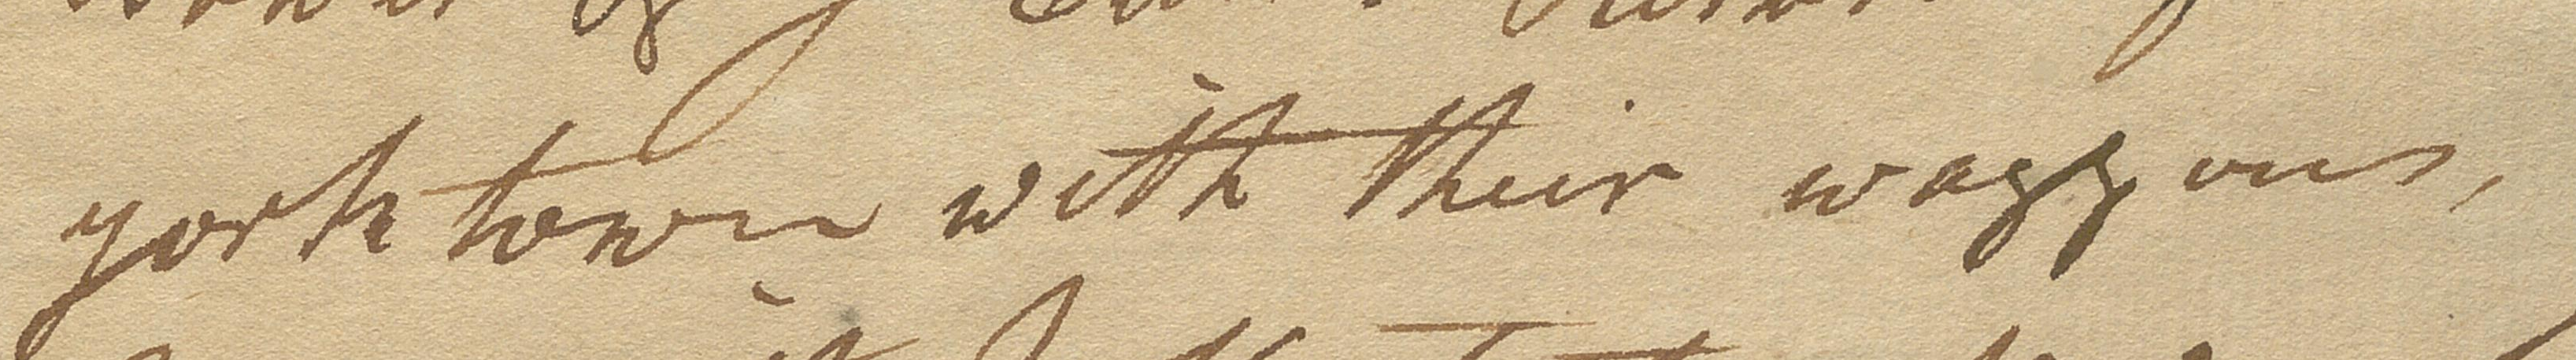yorktown with their waggons,
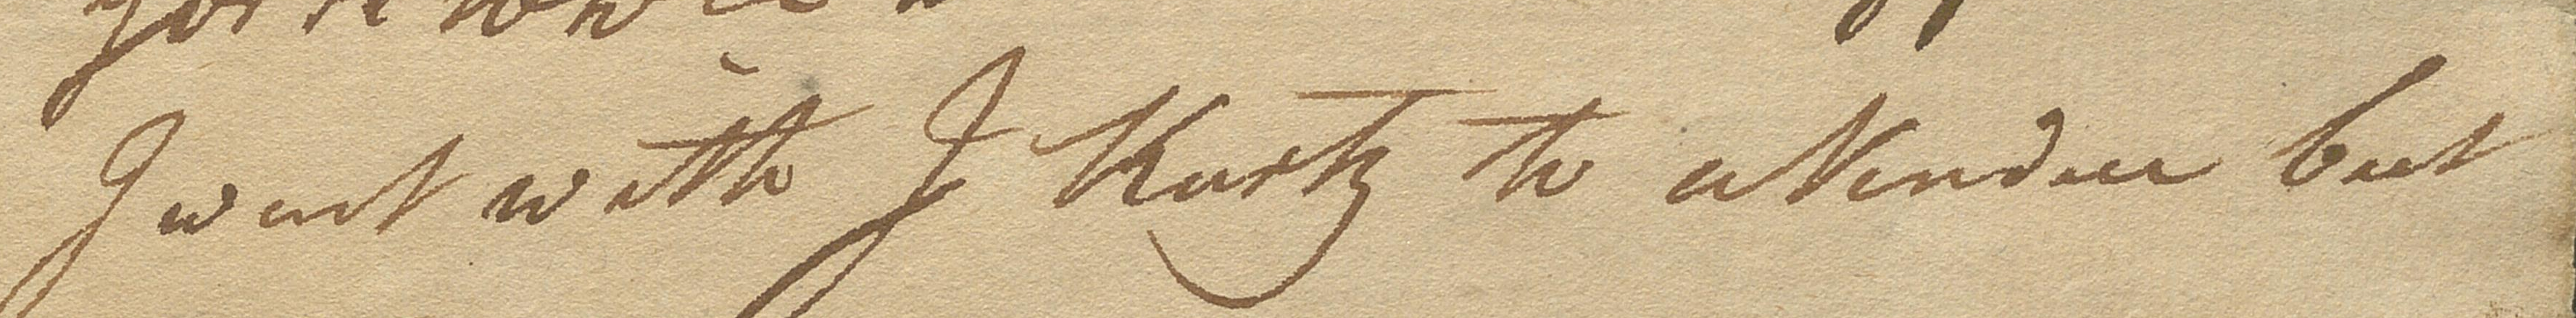I went with I Kurtz to a Vendue but
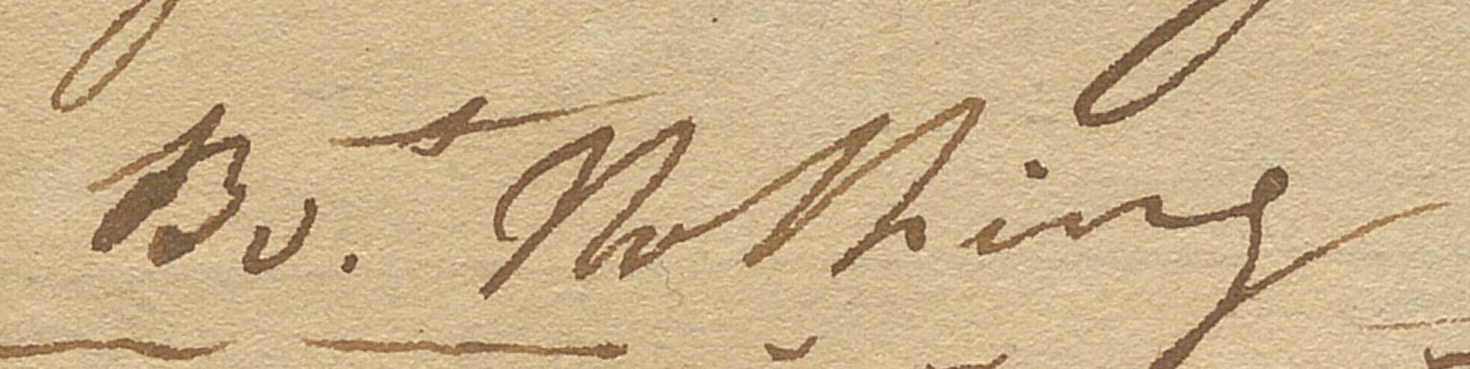Bo^t. Nothing
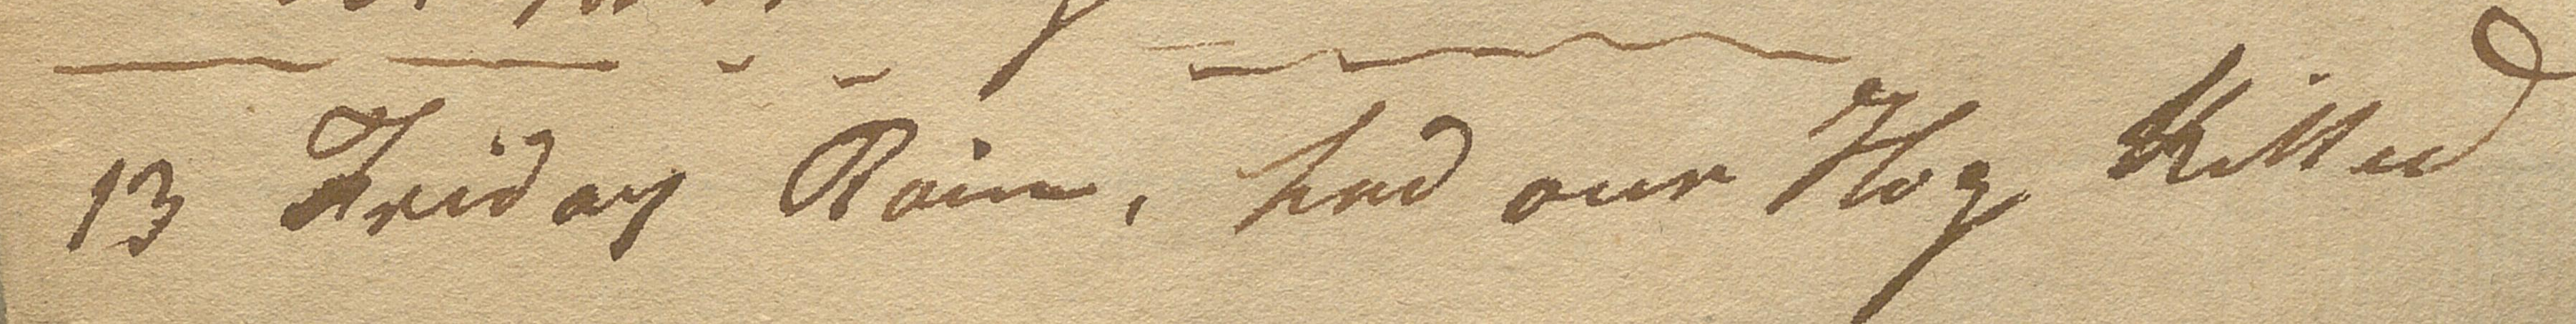13 Friday Rain, had our Hog Kilted
